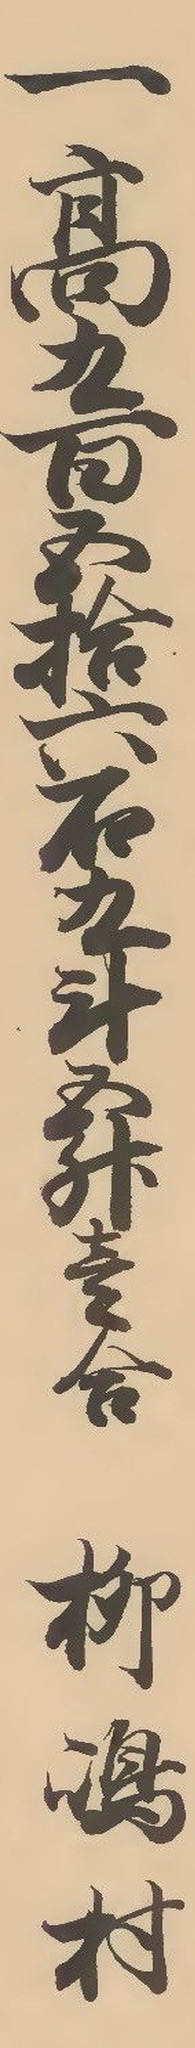一髙九百五拾六石九斗五升壱合柳嶋村
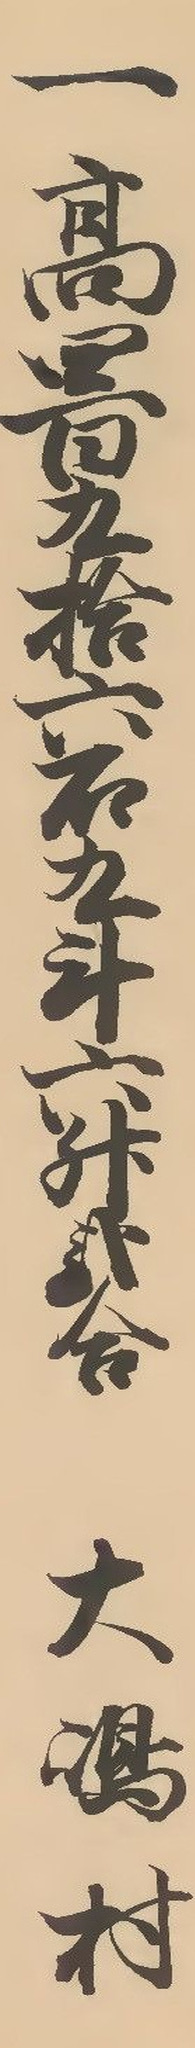一髙四百九拾六石九斗六升弐合大嶋村
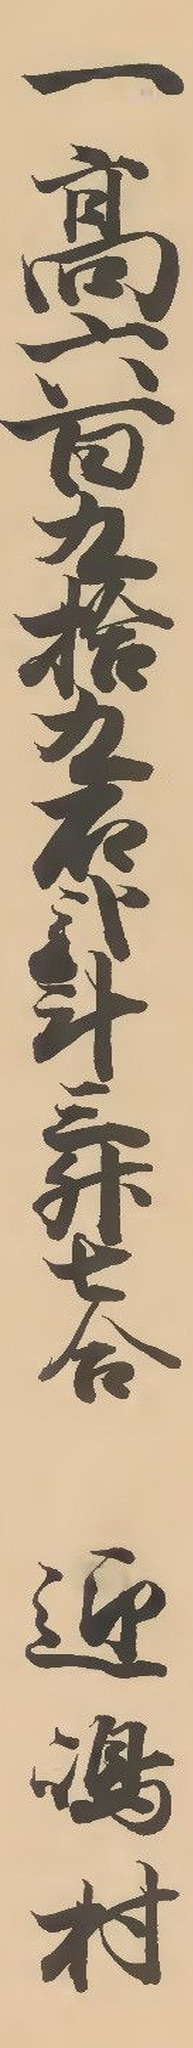一髙六百九拾九石弐斗三升七合迎嶋村
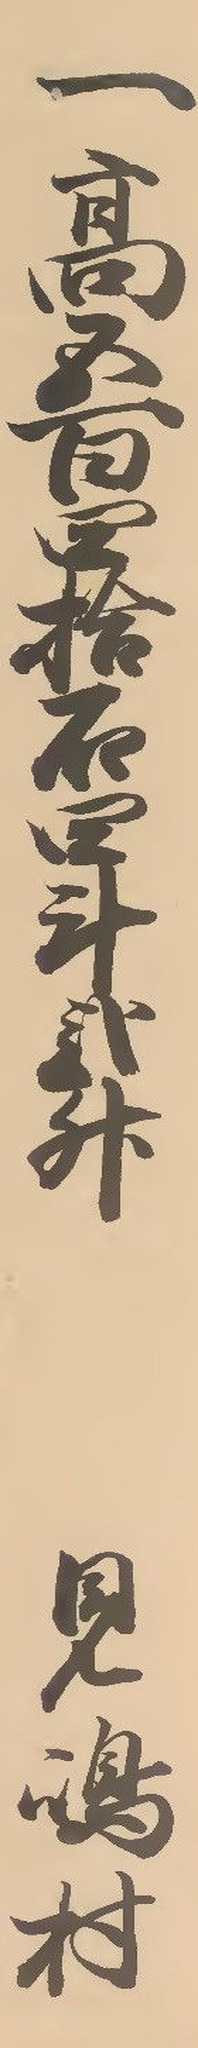一髙五百四拾石四斗弐升見嶋村
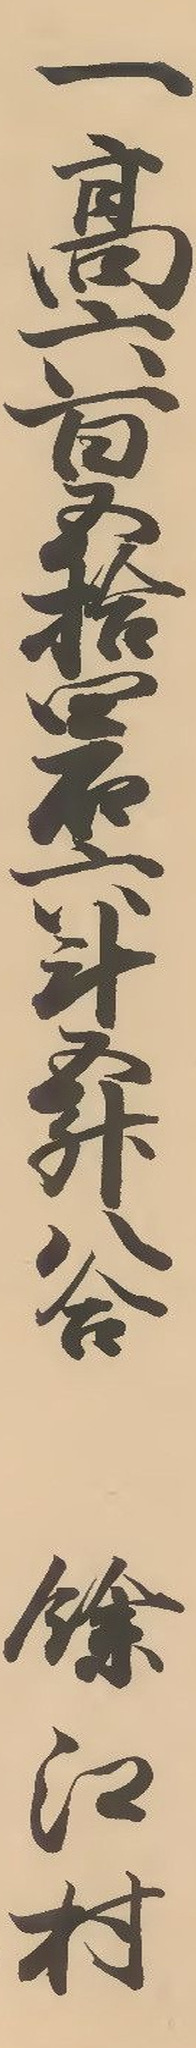一髙六百五拾四石六斗五升八合餘江村
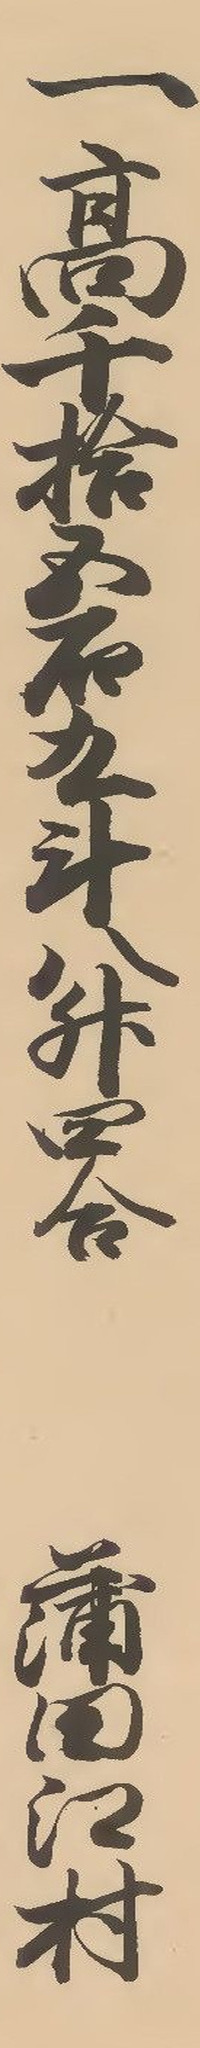一髙千拾五石九斗八升四合蒲田江村
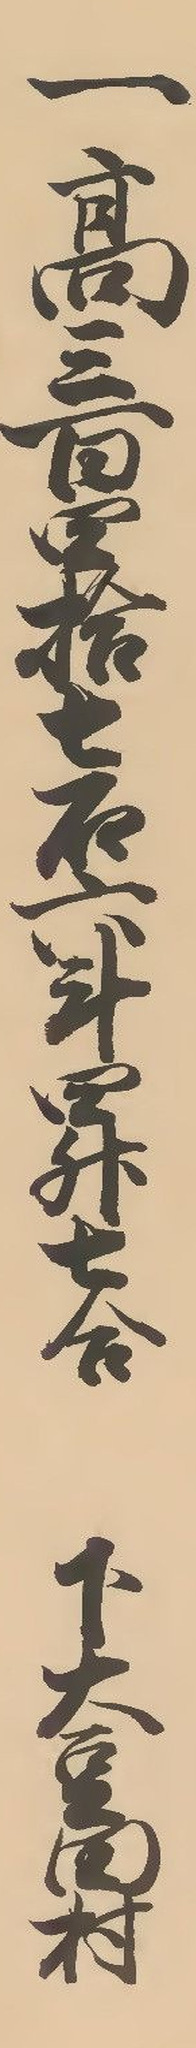一髙三百四拾七石六斗四升七合下大豆田村

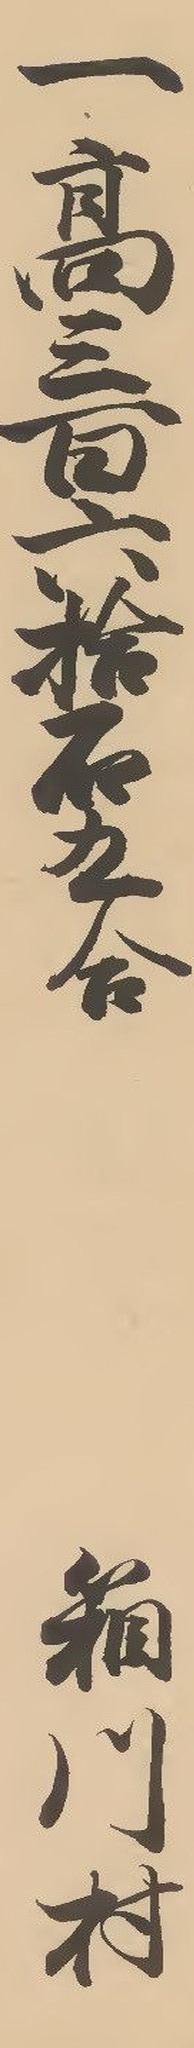一髙三百六拾石九合箱川村
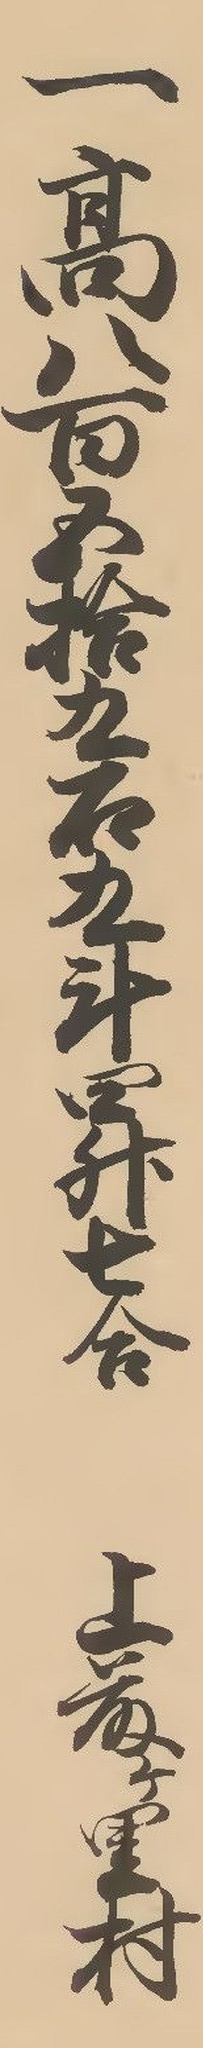一髙八百五拾九石九斗四升七合上藤ケ里村
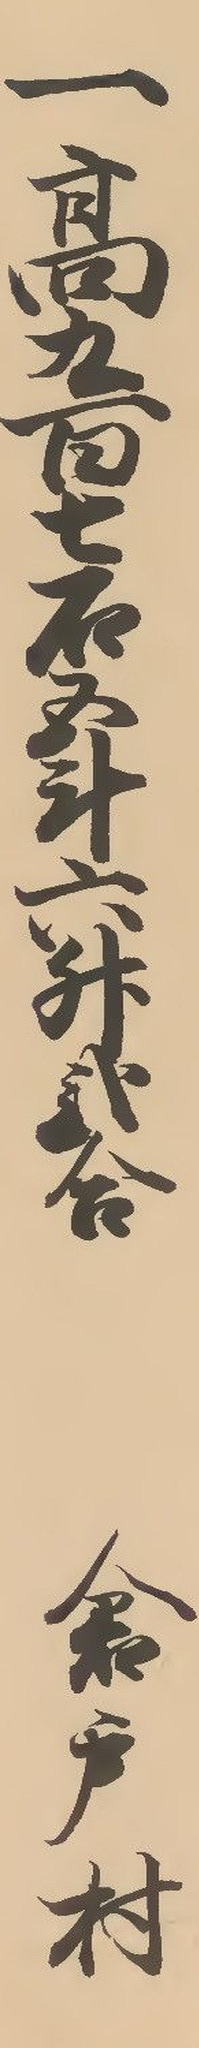一髙九百七石五斗六升弐合倉戸村
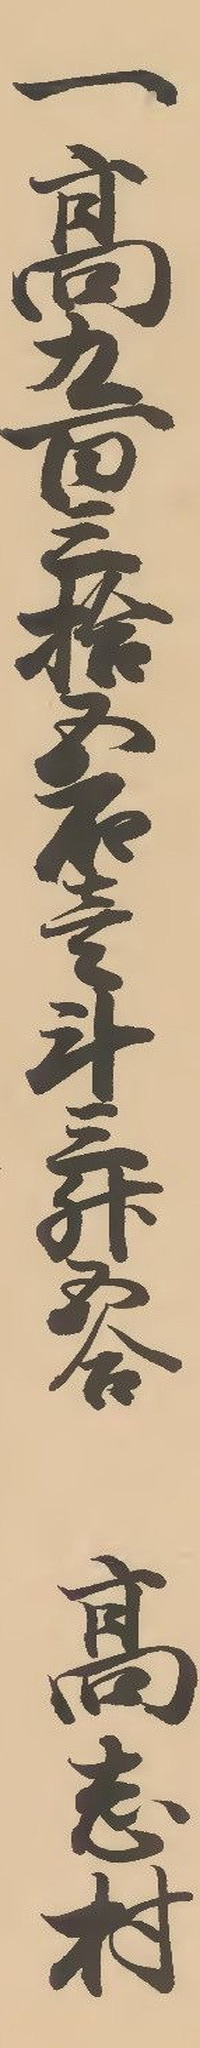一髙九百三拾五石壱斗三升五合高志村
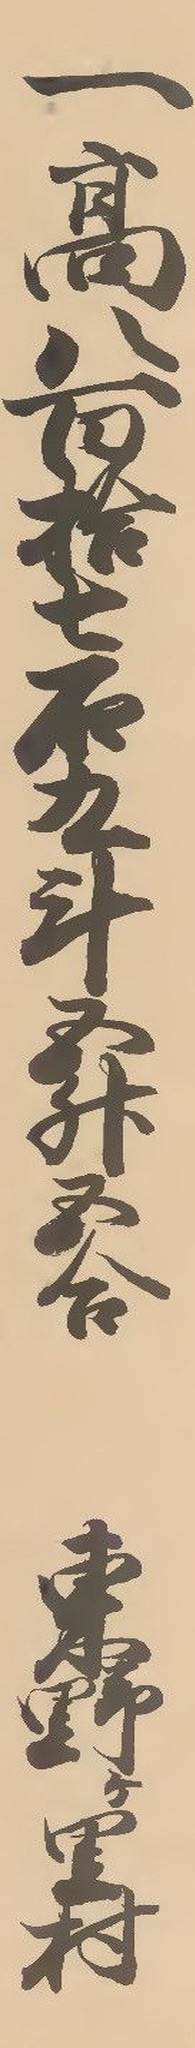一髙八百拾七石九斗五升五合東野ケ里村
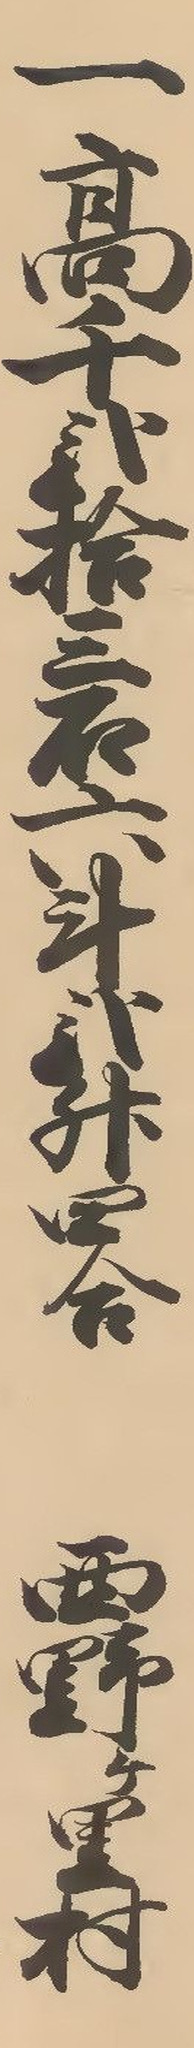一髙千弐拾三石六斗弐升四合西野ケ里村
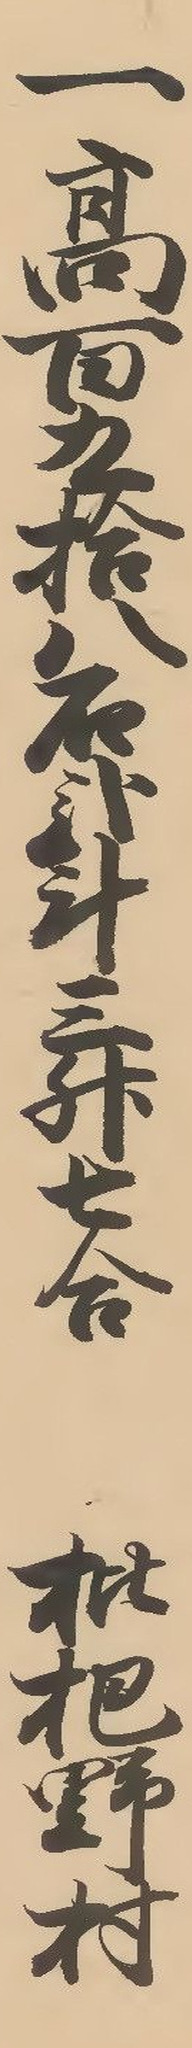一髙百九拾八石弐斗三升七合枇杷野村
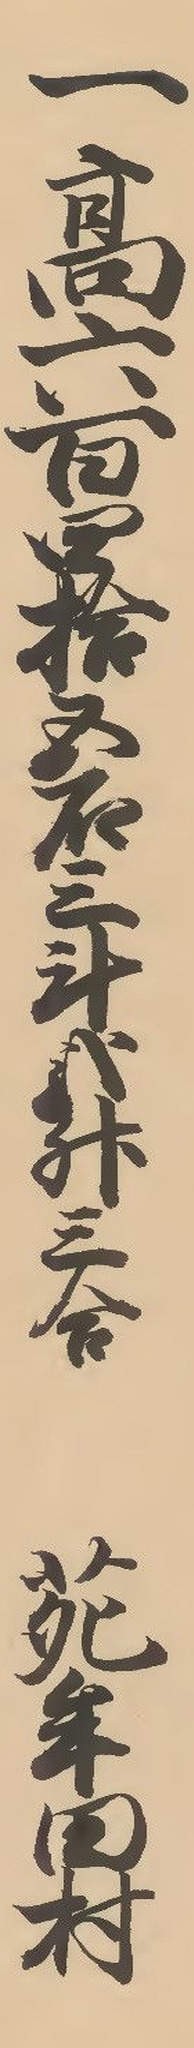一髙六百四拾五石三斗弐升三合田村

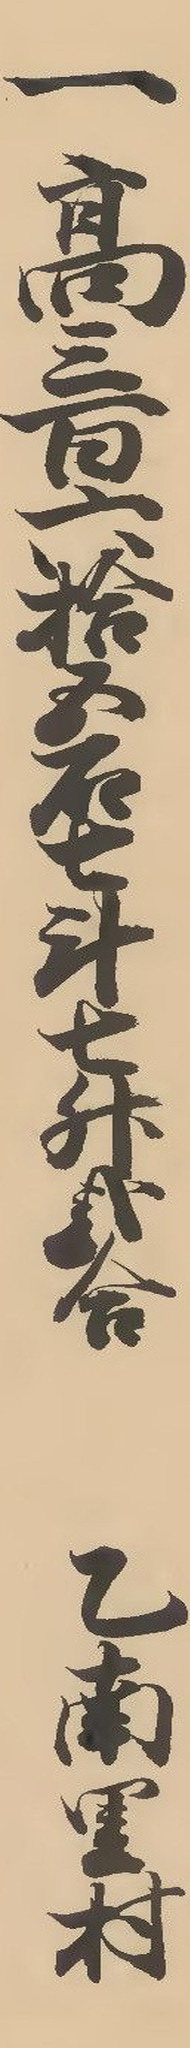一髙三百六拾五石七斗七升弐合乙南里村
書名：肥前国郷帳
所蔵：国立公文書館 National Archives of Japan
